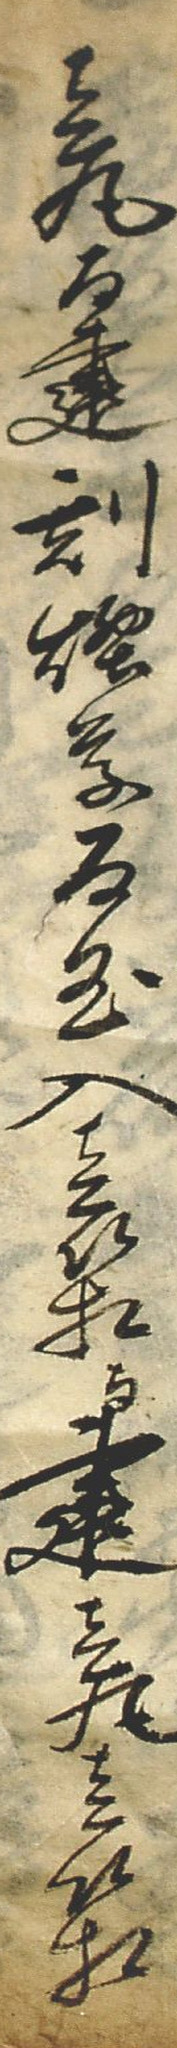壱丸と建刻煙草百玉入壱箱と建壱丸壱箱
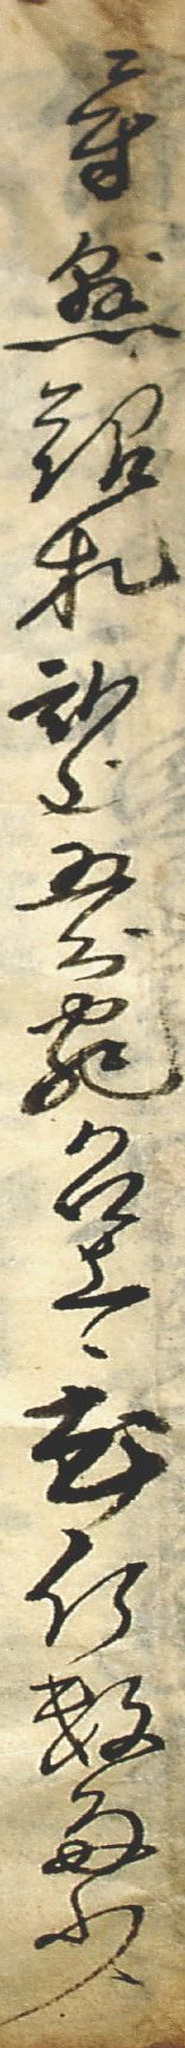に付懸銀札弐匁五分宛召上候尤斤数多少
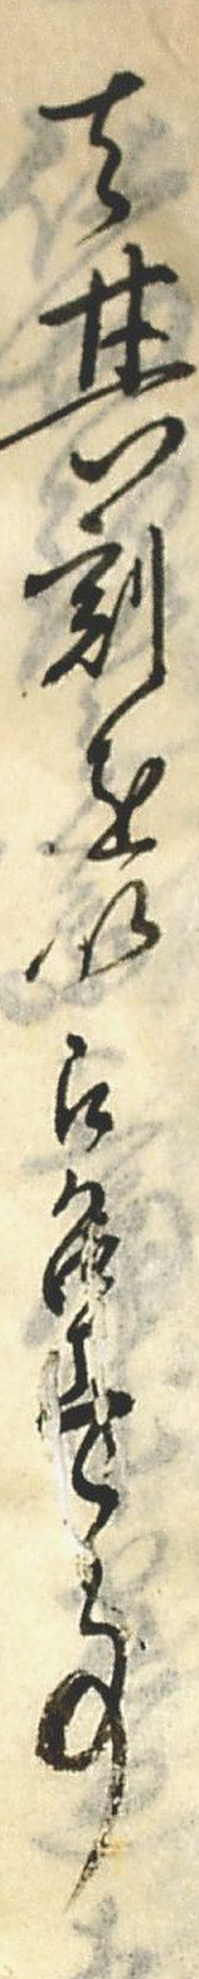は其割を以被召上候事
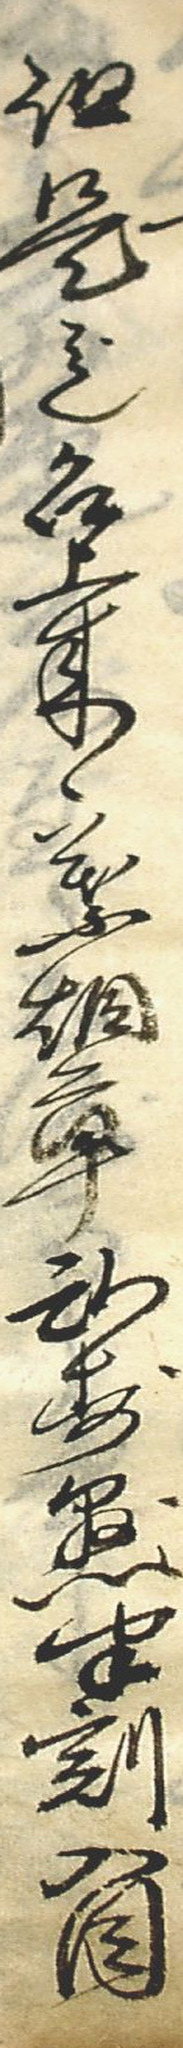但是迄召上来候葉煙草弐歩懸半割入目
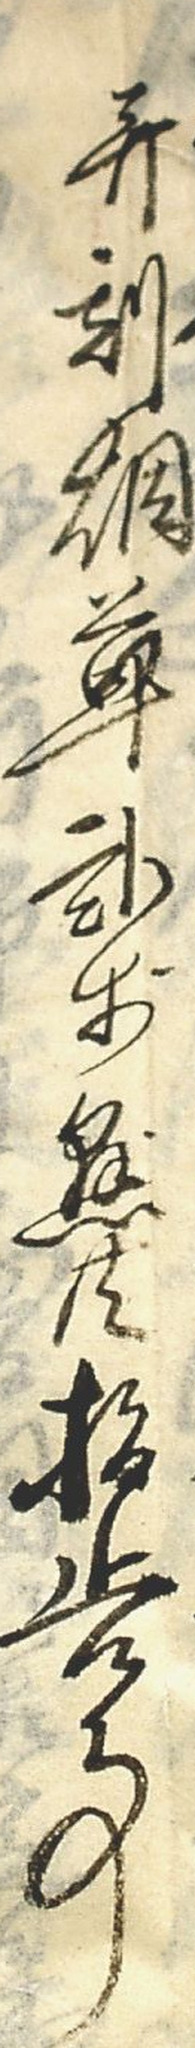并刻煙草弐歩懸共指止候事
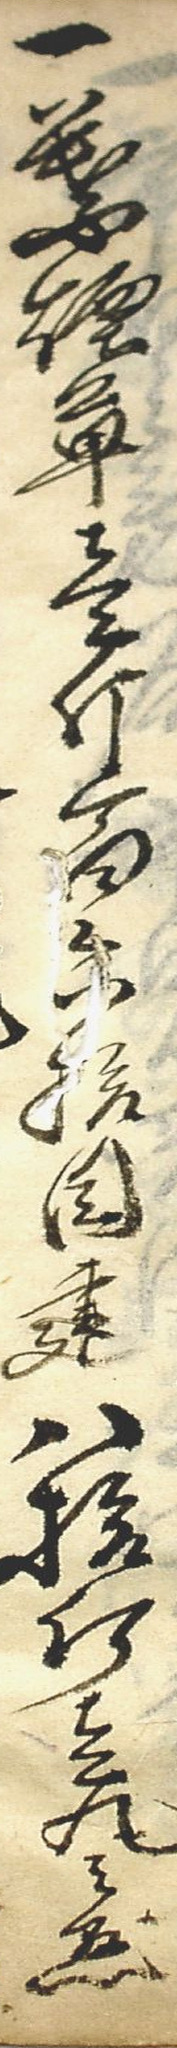一葉煙草壱斤百六拾目建八拾斤壱丸之懸
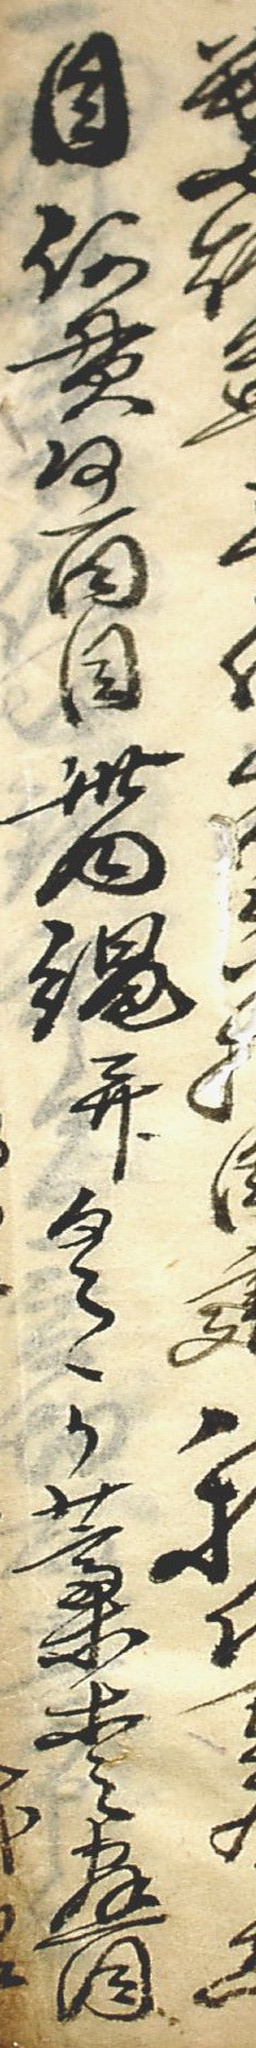目何貫何百目此内縄并くゝり藁等之懸目
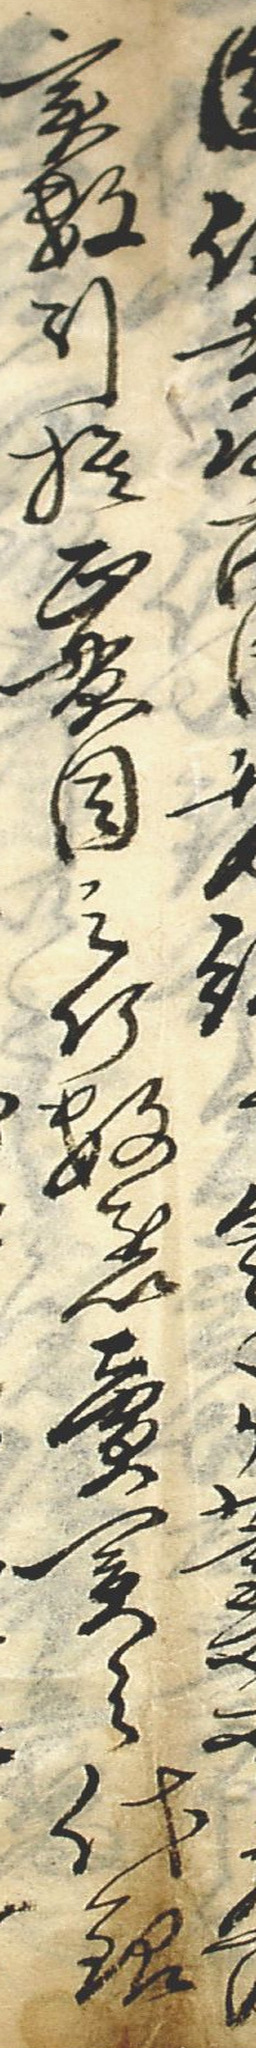実数引捨正貫目之斤数を以売買之代銀
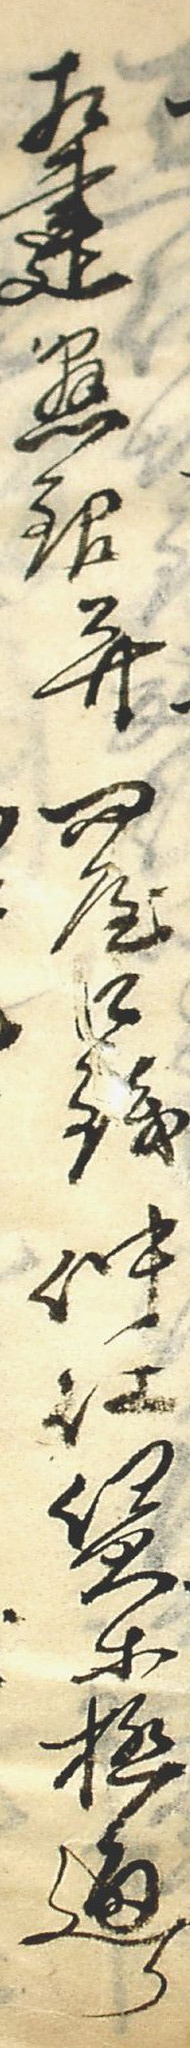相建懸銀并問屋口銭仲仕賃等極通り
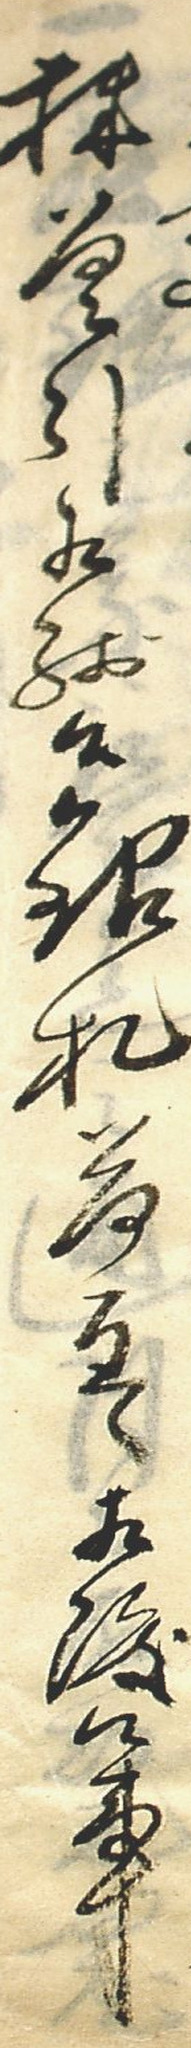株差引相残候銀札荷主へ相渡候事
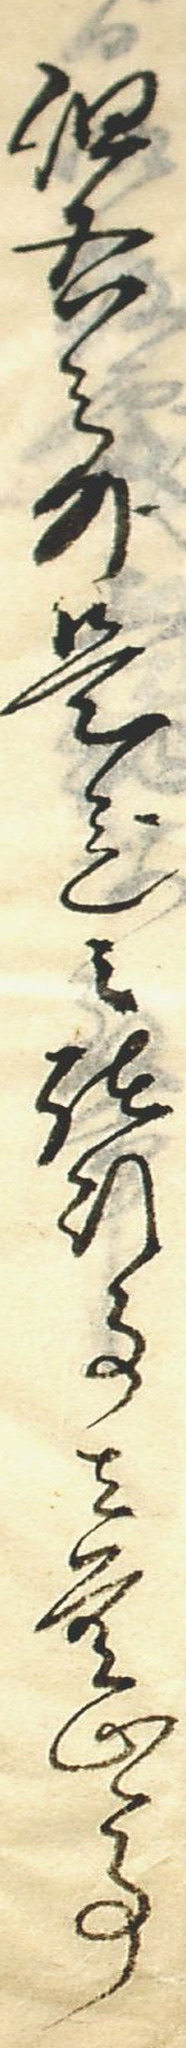但右之外是迄之諸行事は差止候事
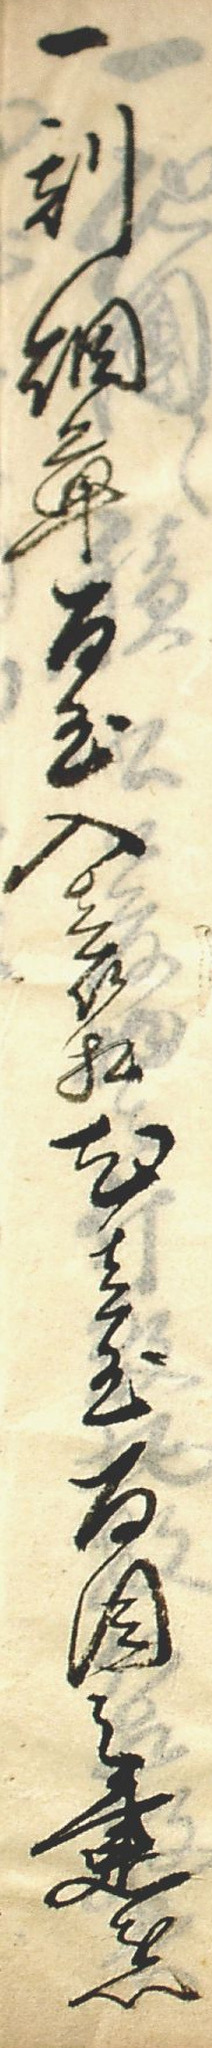一刻煙草百玉入壱箱尤壱玉百目之建を以
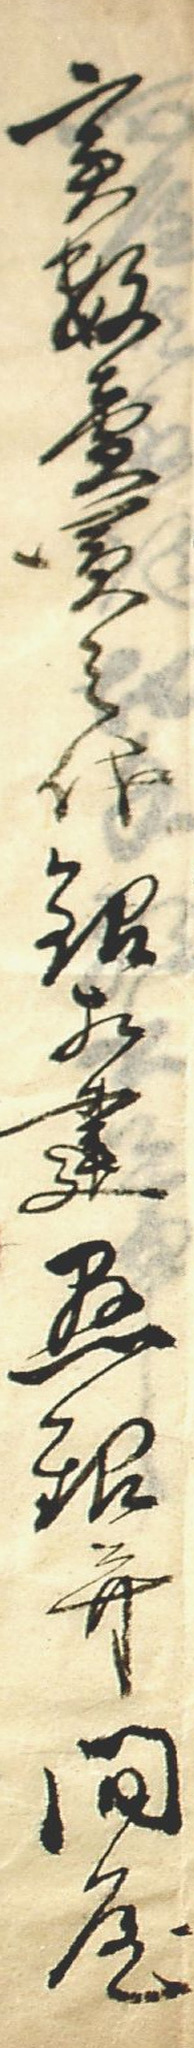実数売買之代銀相建懸銀并問屋
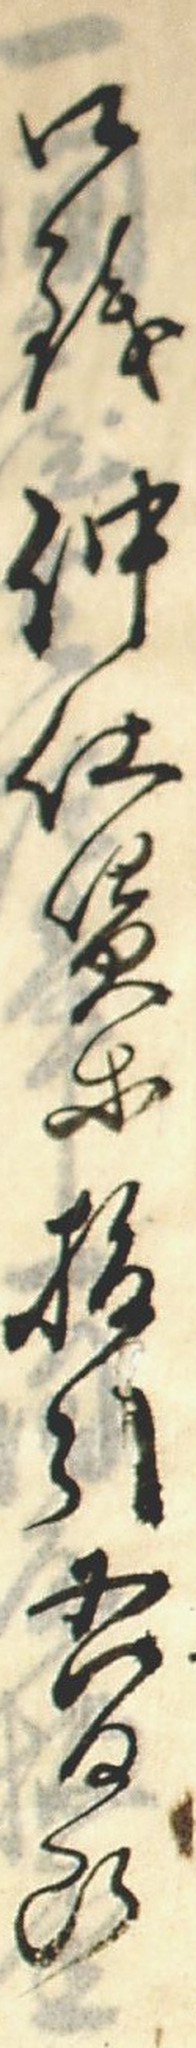口銭仲仕賃等指引右同断
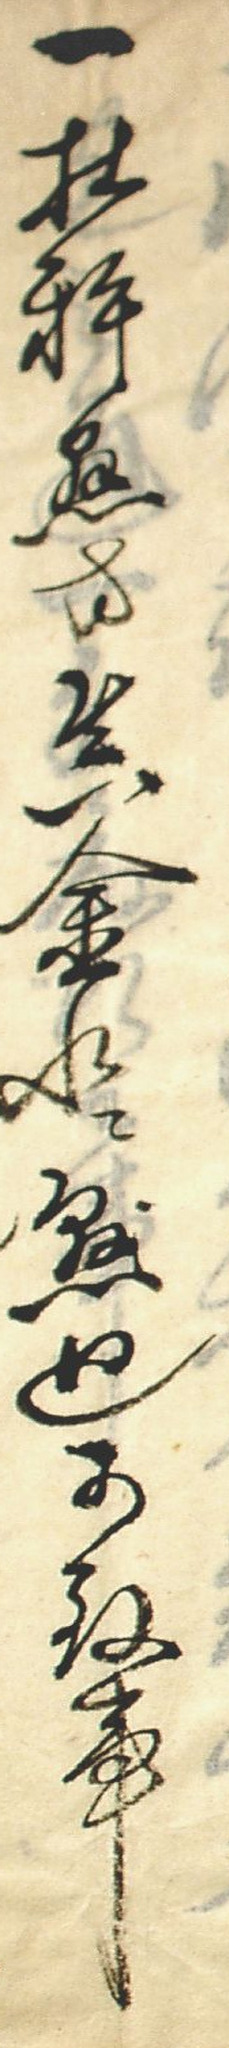一杜秤懸方真金水に懸廻可致事
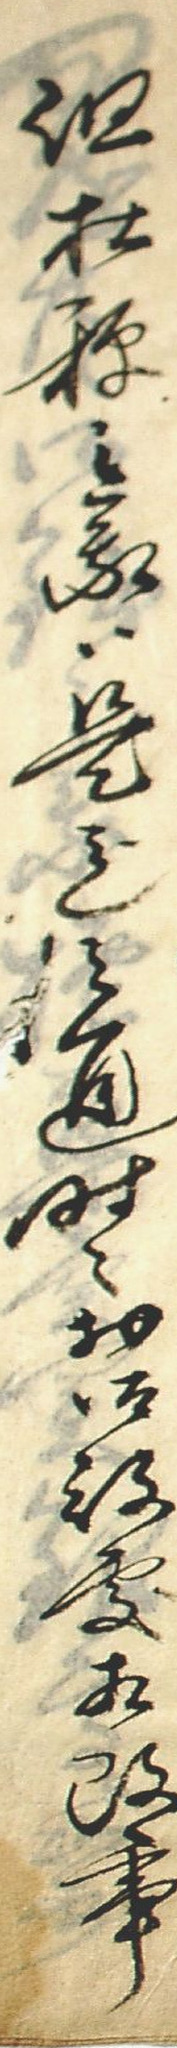但杜秤之義は是迄之通時々於御役処相改候事
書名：煙草問屋扱方一件他
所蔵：鳴門教育大学 Naruto University of Education
